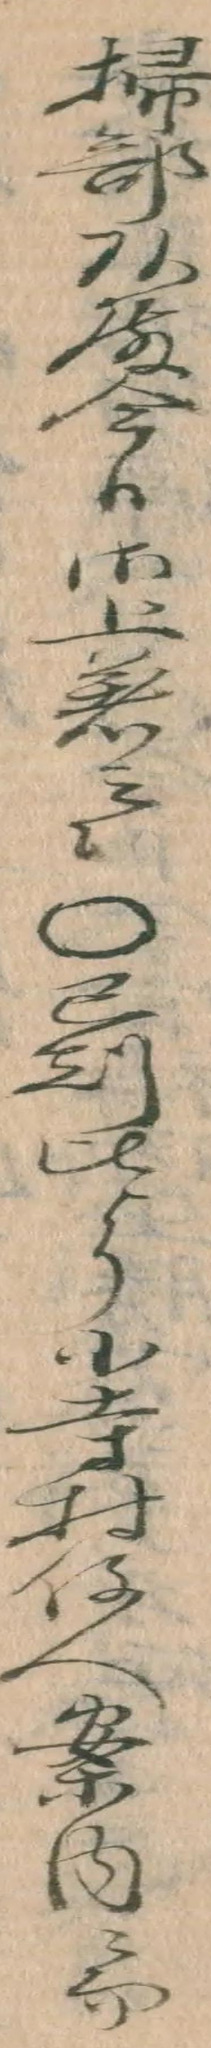掃部頭殿今日御上着云々○巳刻比より小寺村役人案内ニ而
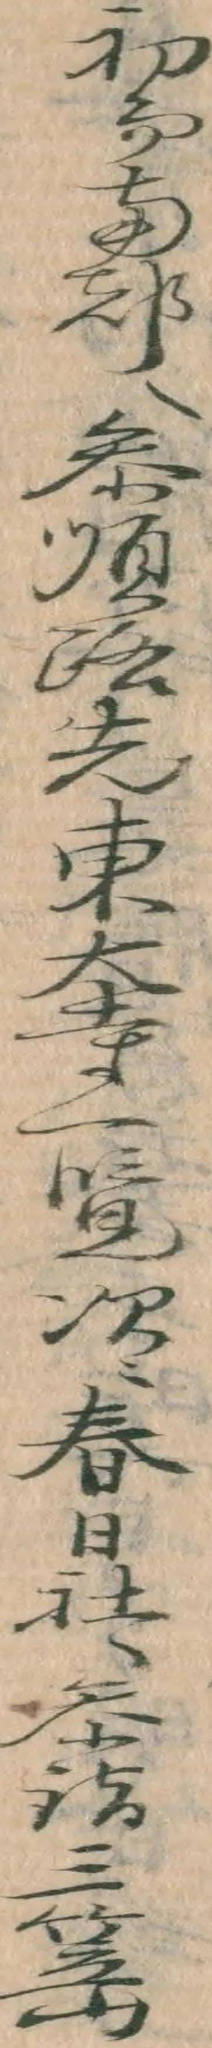初而南都へ参順路先東大寺一覧次に春日社へ参詣三笠山
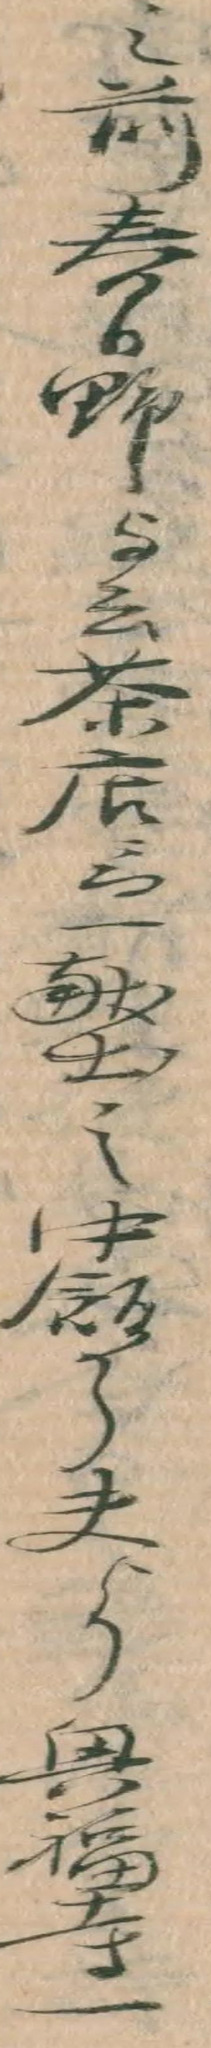之前春日野と云茶店ニ而一献出之中飯了夫より興福寺一
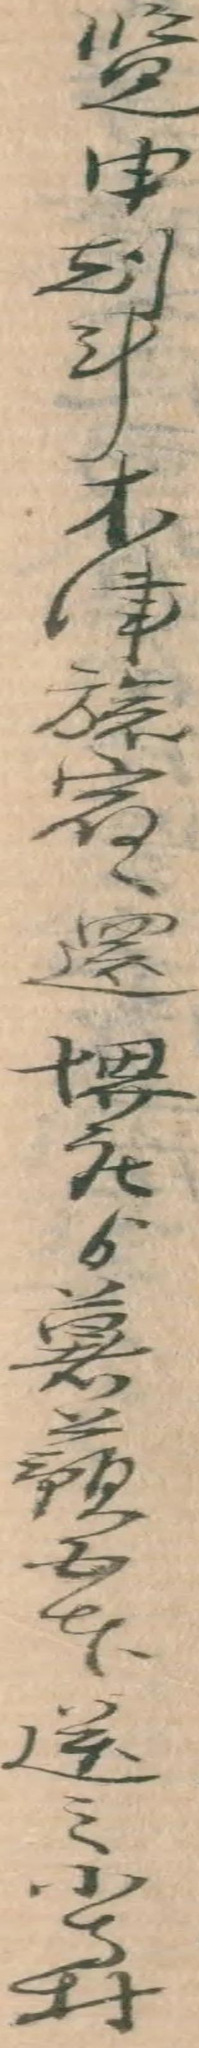登申刻斗木津旅宿へ還堺座ゟ暮蕷五本送之小寺村
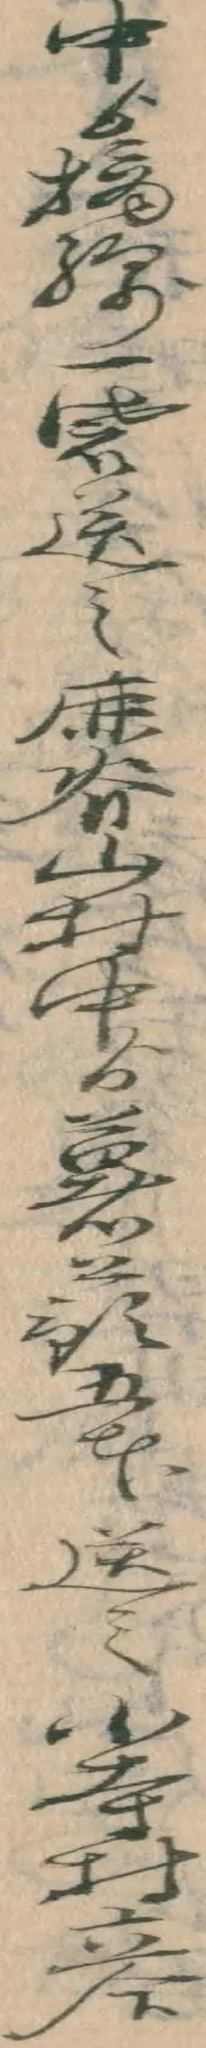中ゟ搗一袋送之鹿谷山村中ゟ暮蕷五本送之小寺村立合
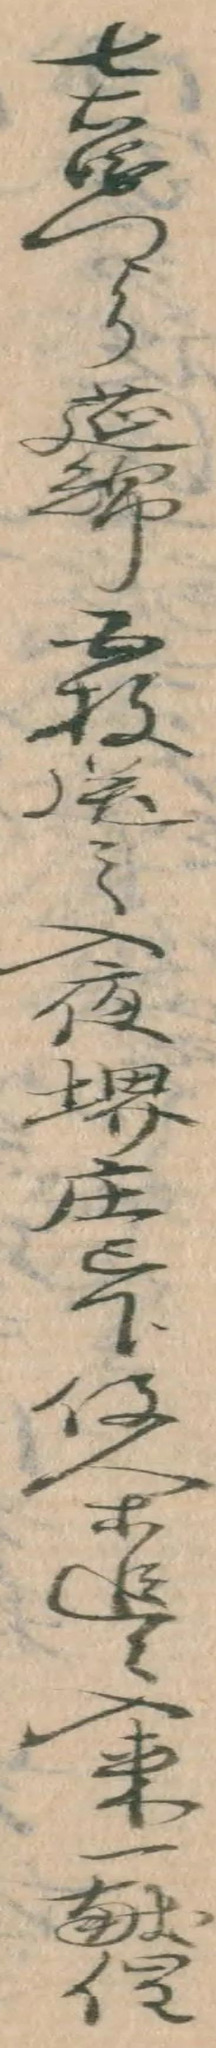七右衛門ゟ莚綿五枚送之入夜堺庄已下役人等追々入来一献催
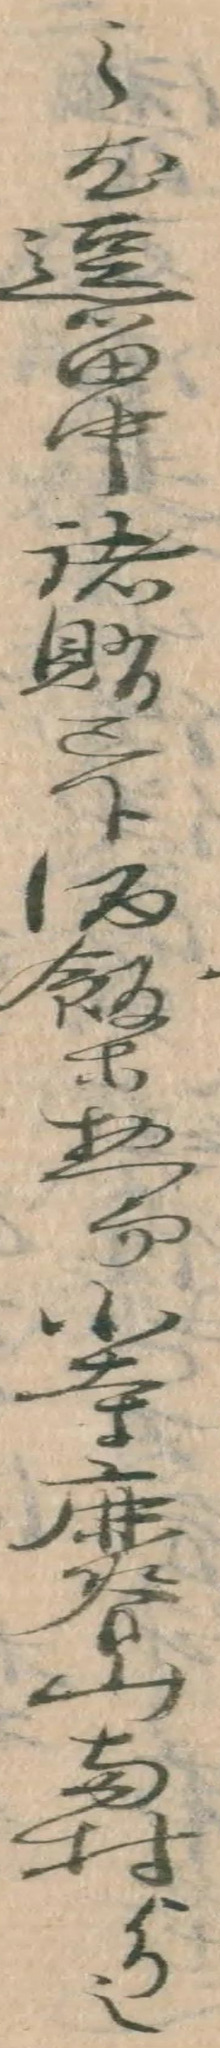之尤逗留中諸賄已下酒飯等惣而小寺鹿谷山両村より之
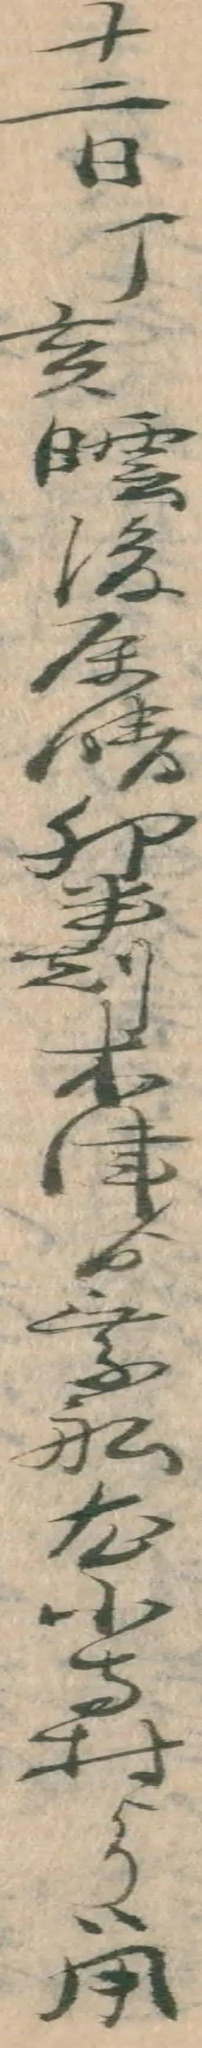十二日丁亥曇後尾晴卯半刻木津ゟ乗舩尤小寺村より御用
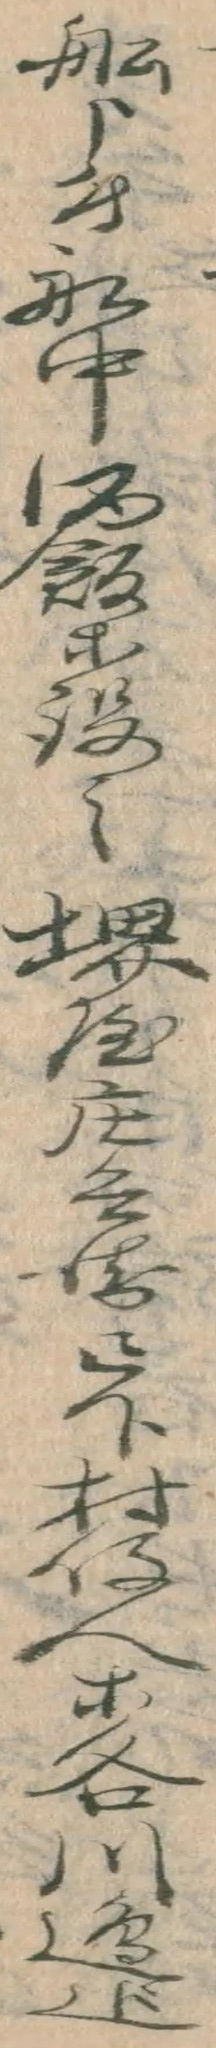船申付舩中酒飯等設也堺屋庄兵衛已下村役人等各川邊迄
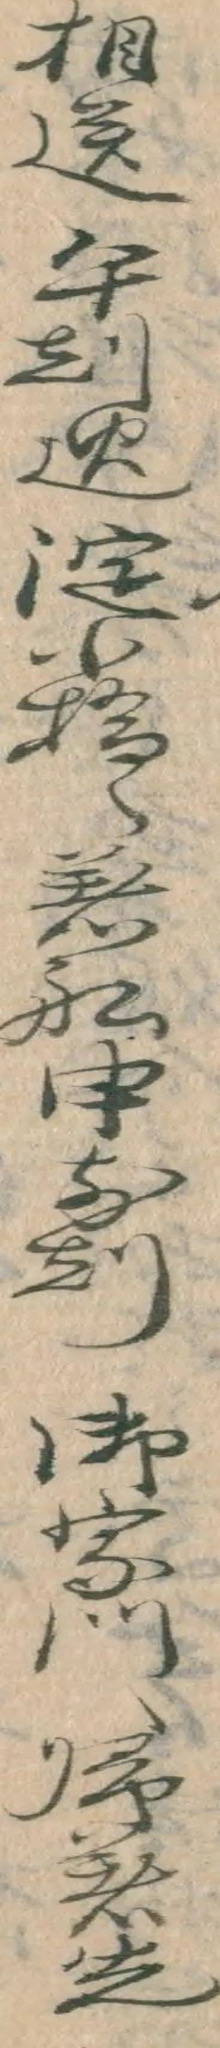相送午刻過淀小橋へ着舩申前刻御家門へ帰着先
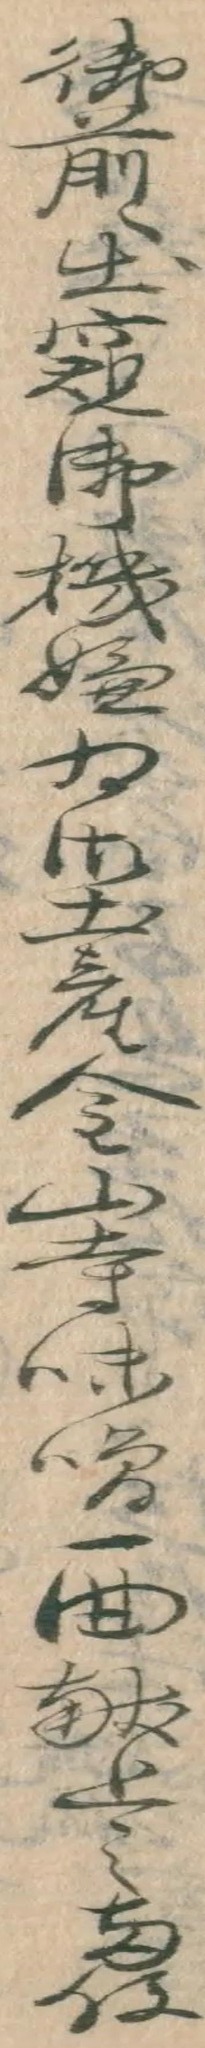御前へ出窺御機嫌為御土産金山寺味噌一曲献上之両役
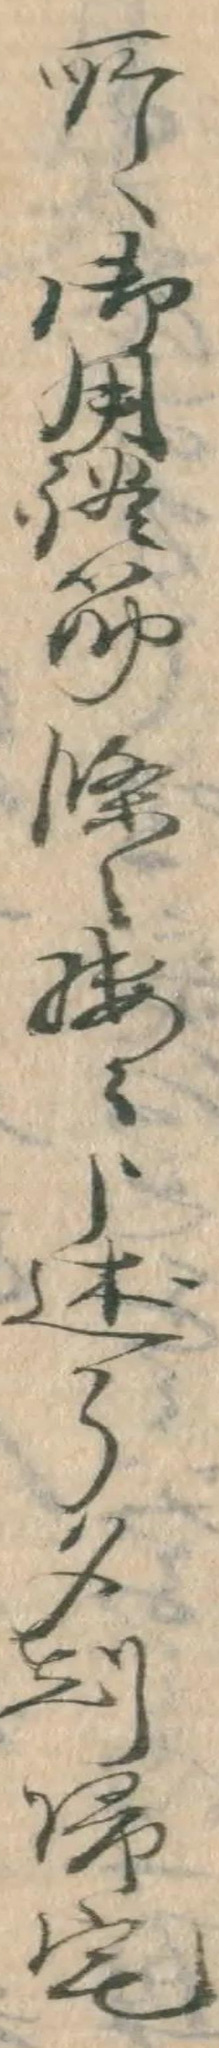所へ御用談筋條々楼々申述了夕刻帰宅
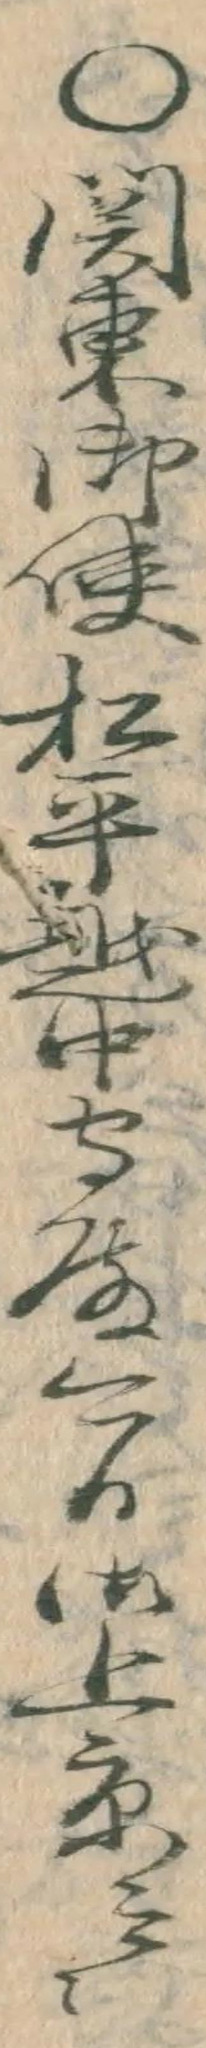○関東御使松平越中守殿今日御上京云々
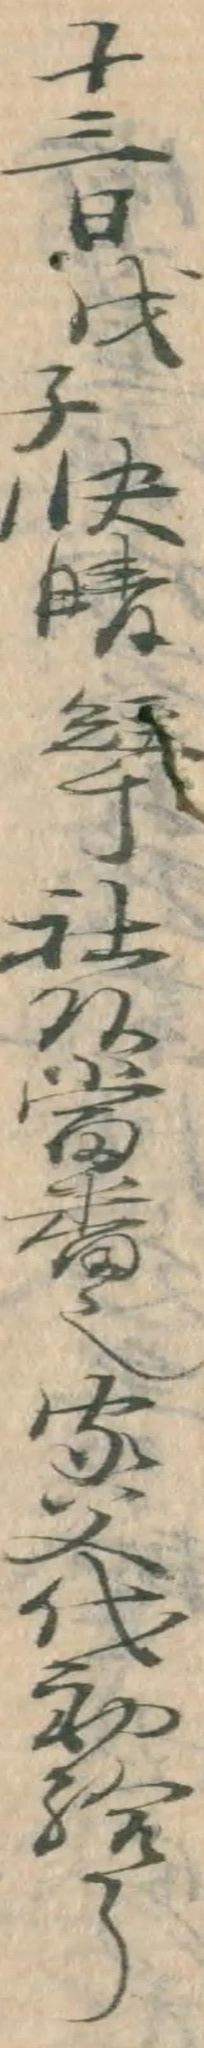十三日戊子快晴経千社頭當番也家父代勤給了
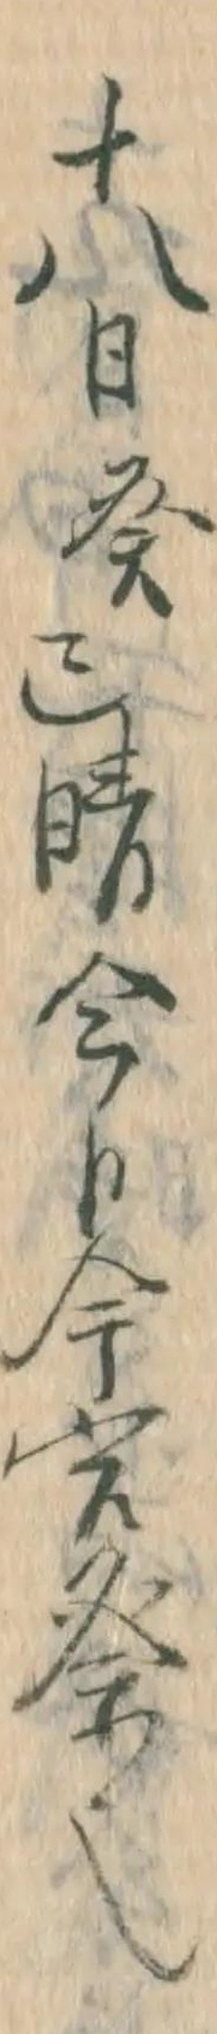十八日癸巳晴今日今宮祭也

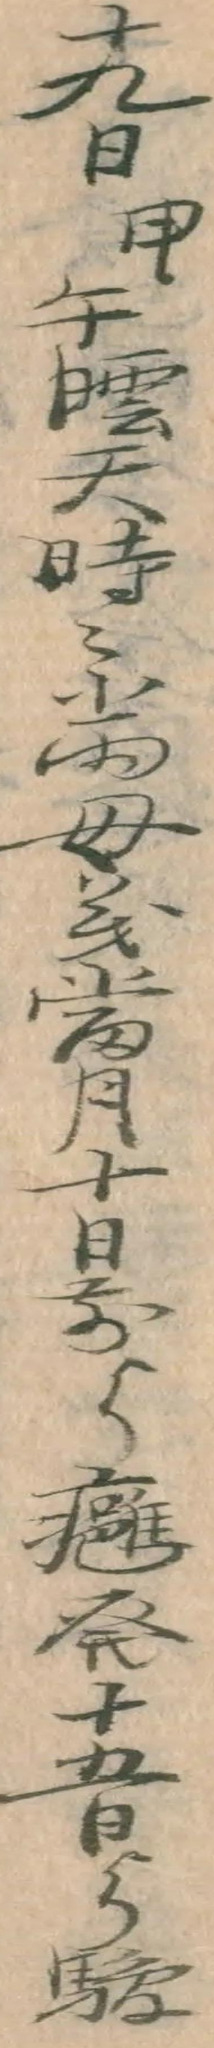十九日甲午曇天時々小雨母義當月十日前より癰発十五日より駿
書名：賀茂社記録. 第65冊
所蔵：国立国会図書館 National Diet Library, JAPAN
